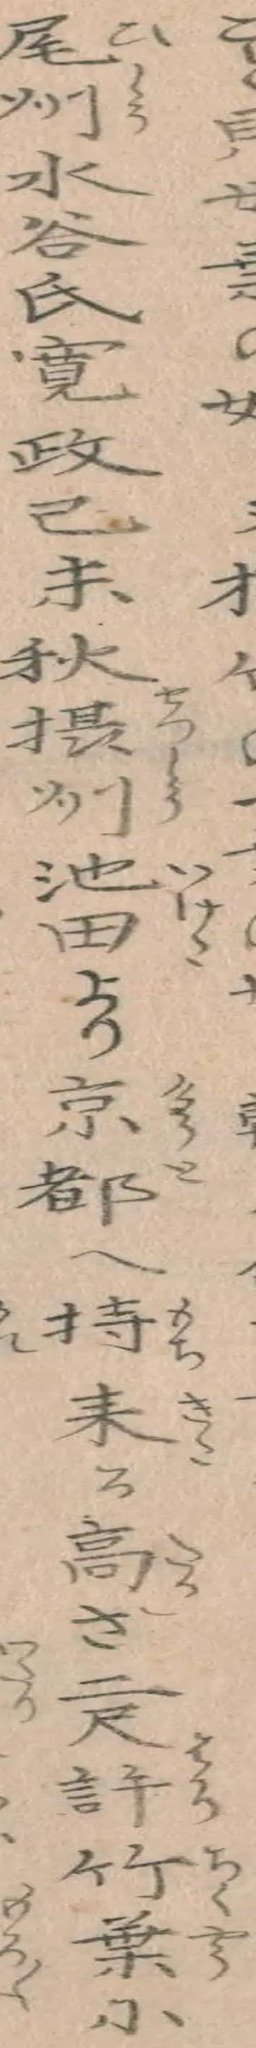尾州水谷氏寛政己未秋摂州池田より京都へ持来る高さ二尺許竹葉に
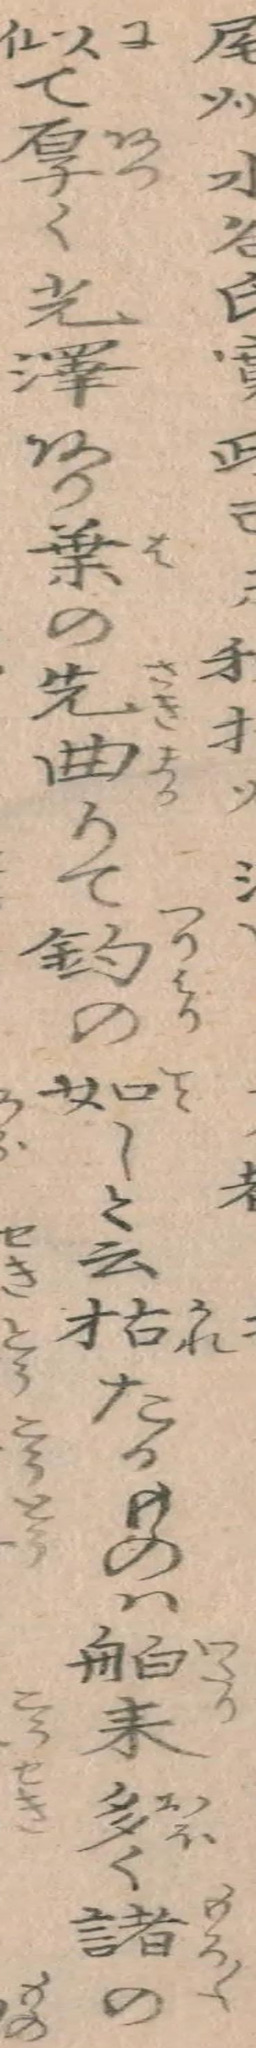似て厚く光沢あり葉の先曲りて釣の如しと云枯たるものは舶来多く諸の
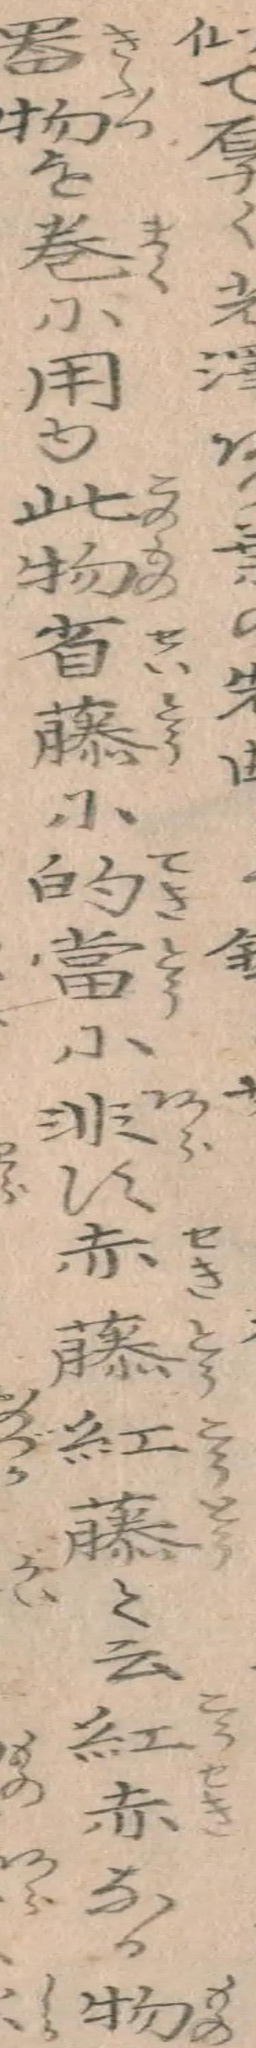器物を巻に用ゆ此物省藤に的当に非す赤藤紅藤と云紅赤なる物
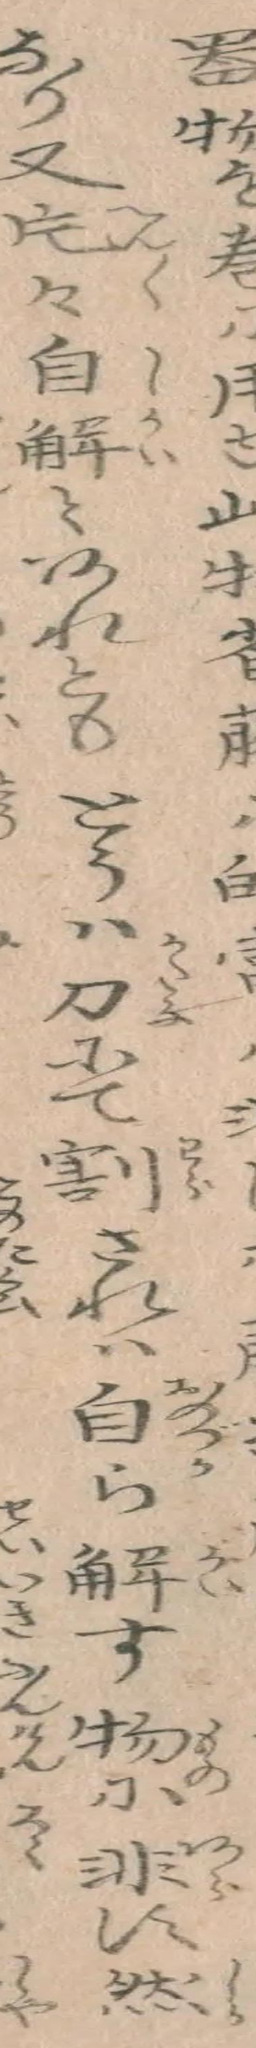なり又片々自解とあれともとうは刀にて割されは自ら解す物に非す然
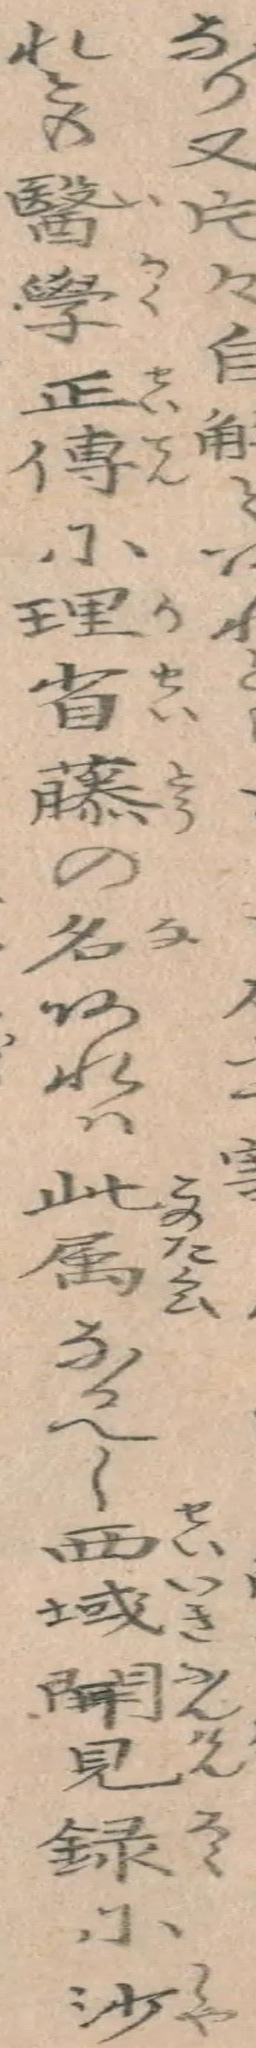れとも医学正伝に理省藤の名あれは此属なるへし西域聞見録に沙

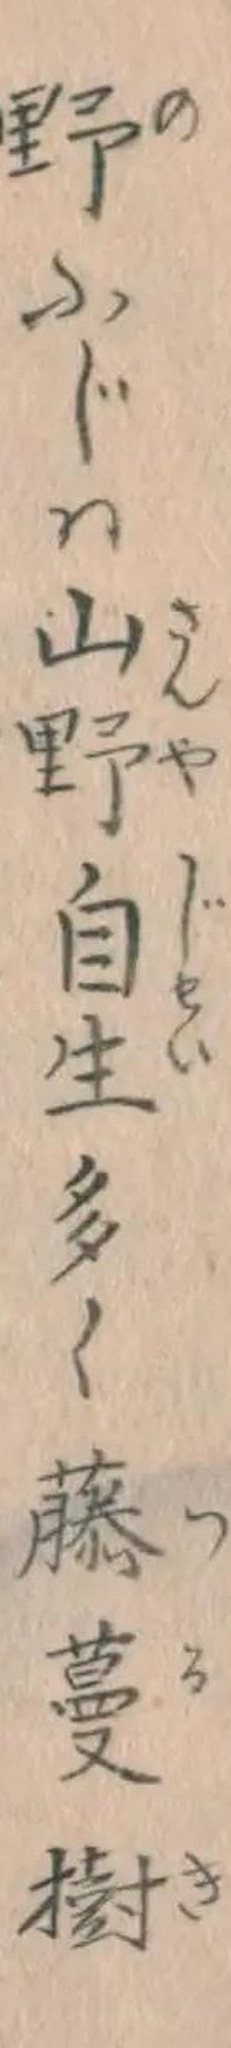野ふじは山野自生多く藤蔓樹
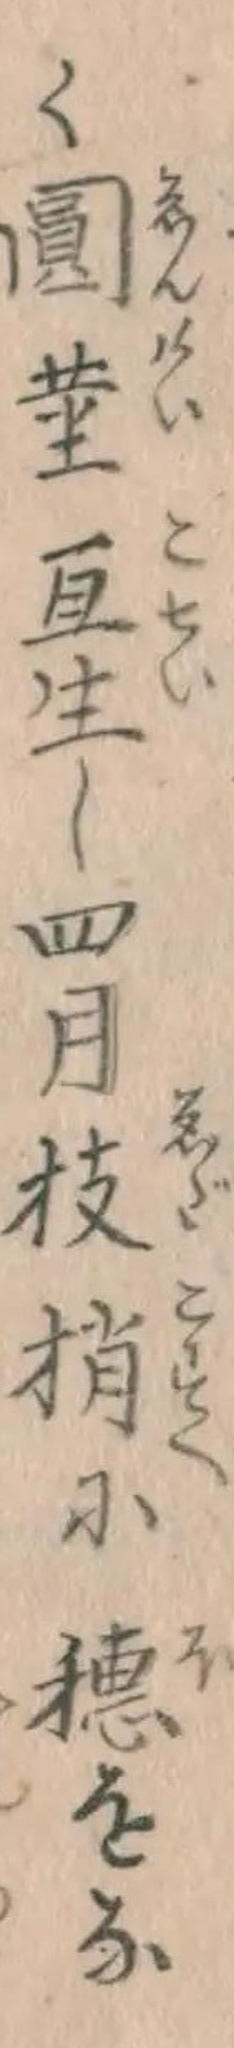く円茎互生し四月枝梢に穂をな

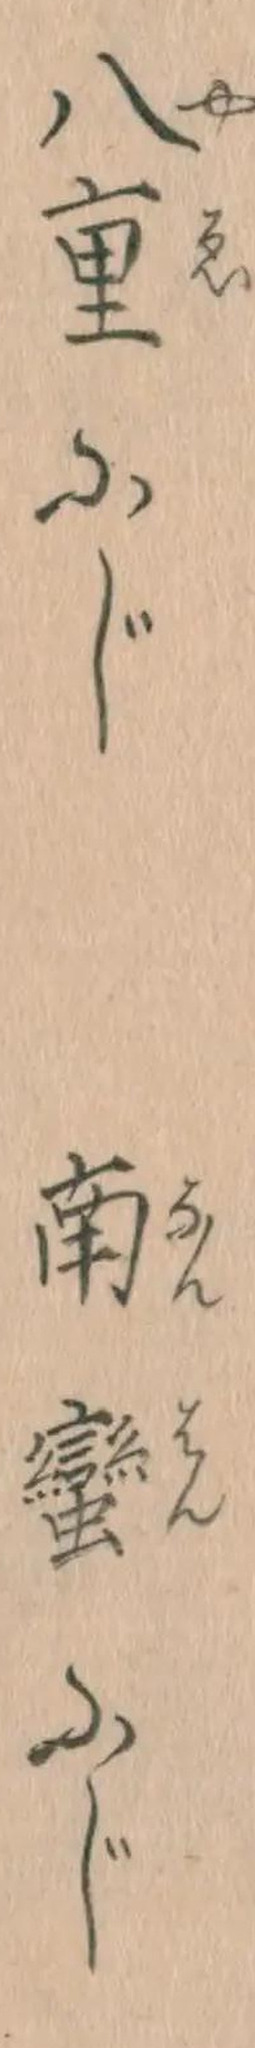八重ふじ南蛮ふじ
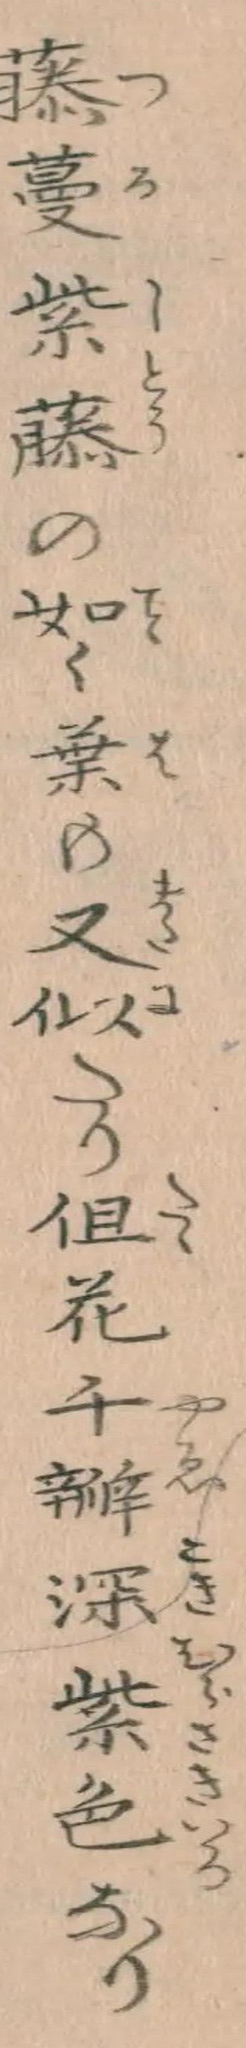藤蔓紫藤の如く葉も又似たり但花千弁深紫色なり
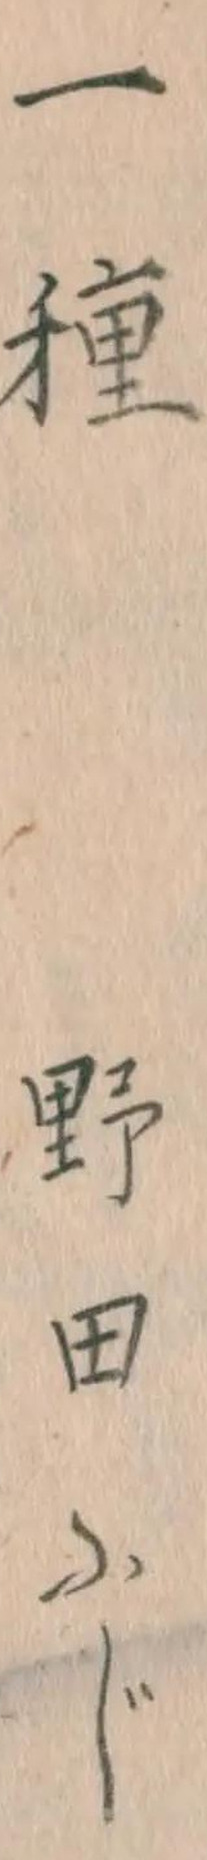一種野田ふじ
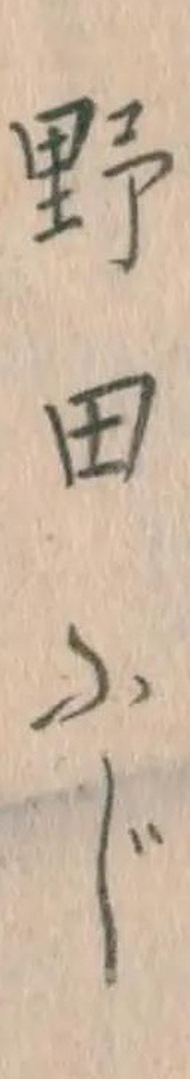野田ふじ
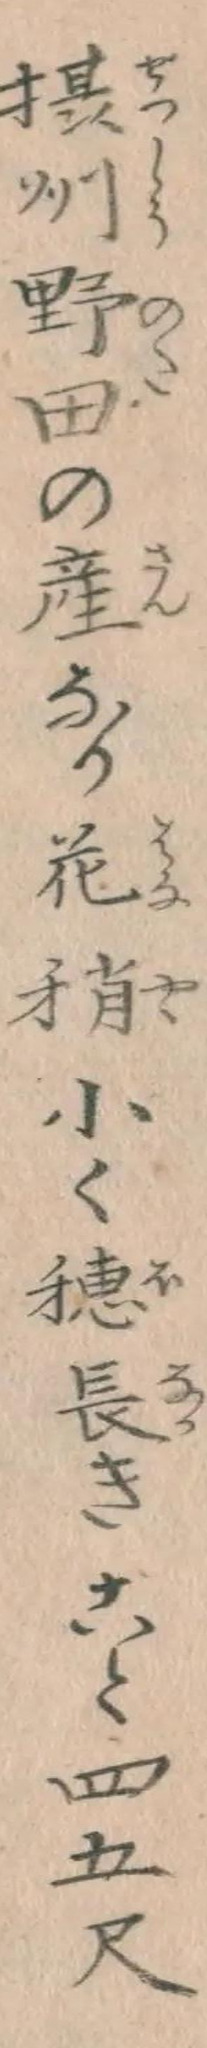摂州野田の産なり花稍小く穂長きこと四五尺

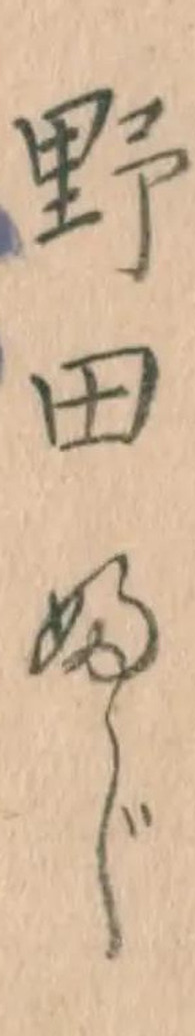野田ふじ

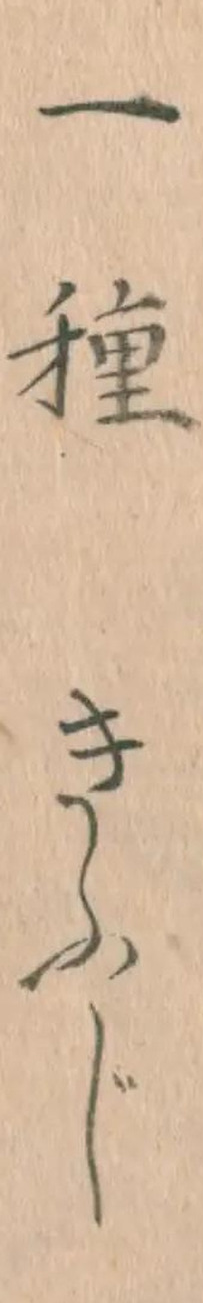一種きふじ
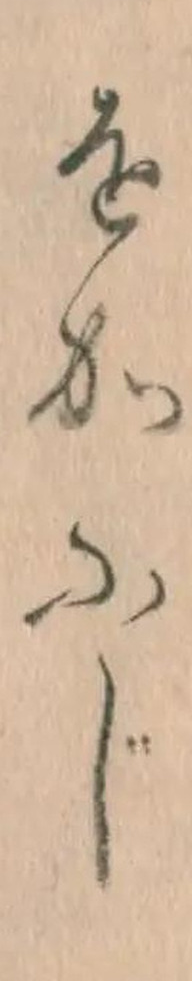をかふじ
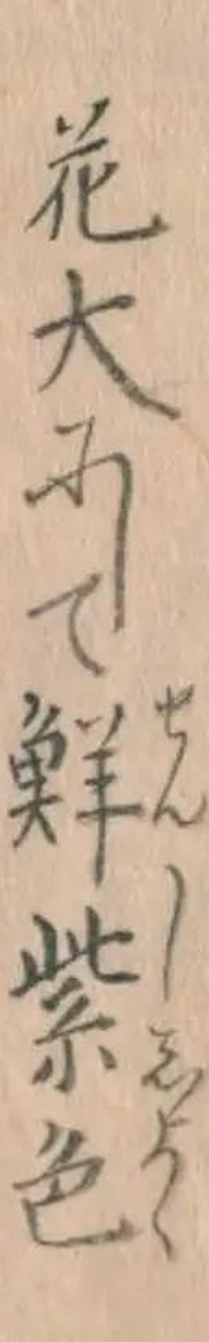花大にして鮮紫色
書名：本草図譜. 巻31-33
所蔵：国立国会図書館 National Diet Library, JAPAN
